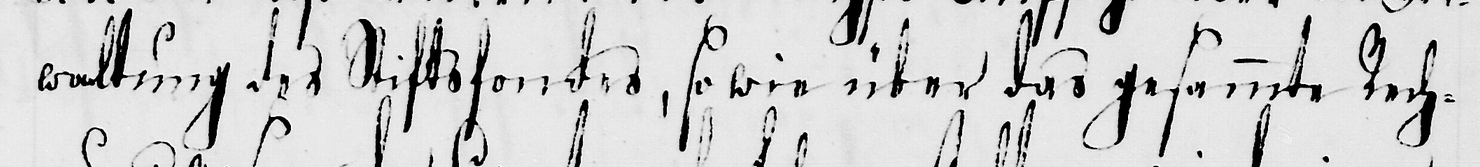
rwaltung des Stiftsfondes, so wie über das gesammte Rech¬
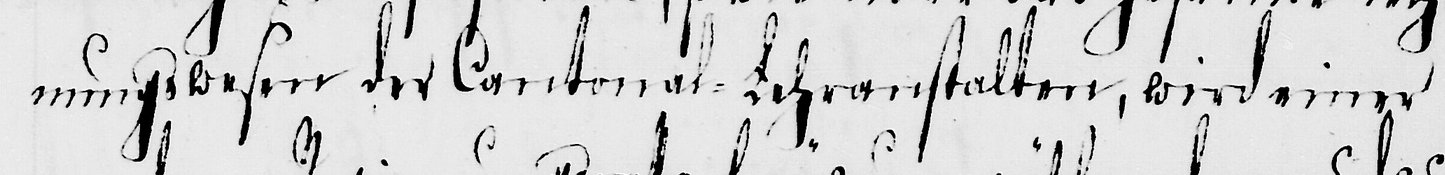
nungswesen der Cantonal-Lehranstalten, wird einer
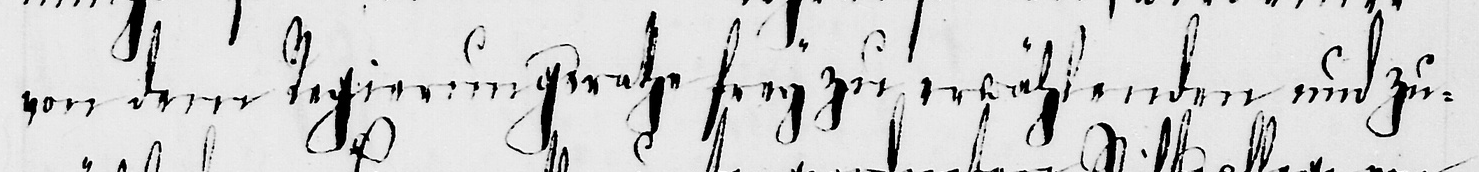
von dem Regierungsrathe frey zu erwählenden und zu¬
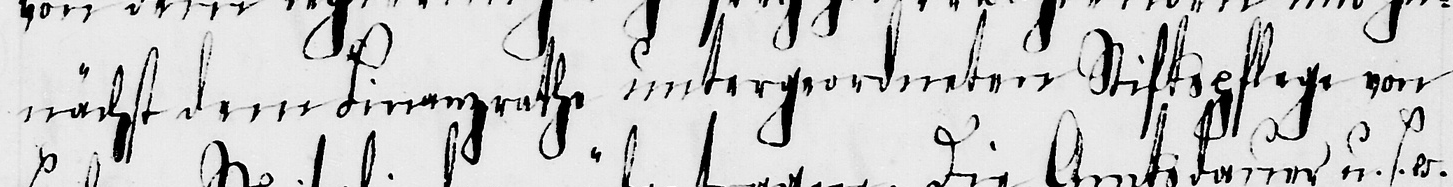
nächst dem Finanzrathe untergeordneten Stiftspflege von
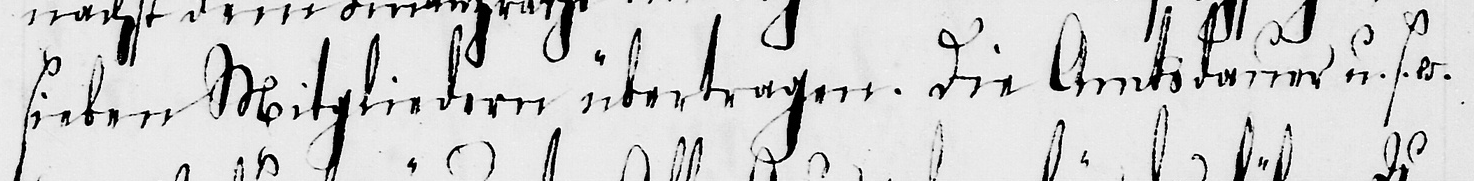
sieben Mitgliedern übertragen. Die Amtsdauer u. s.
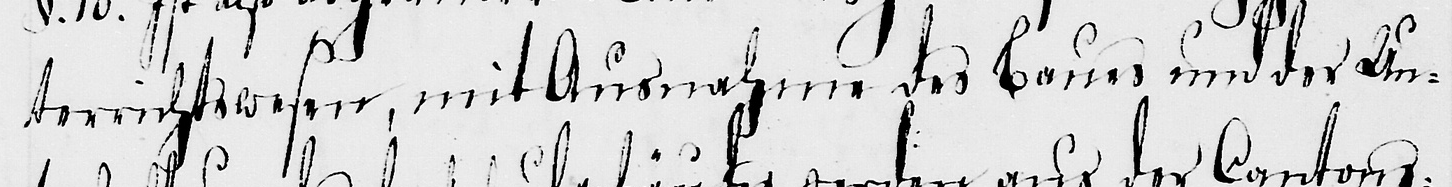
terrichtswesen, mit Ausnahme des Baues und der Un¬
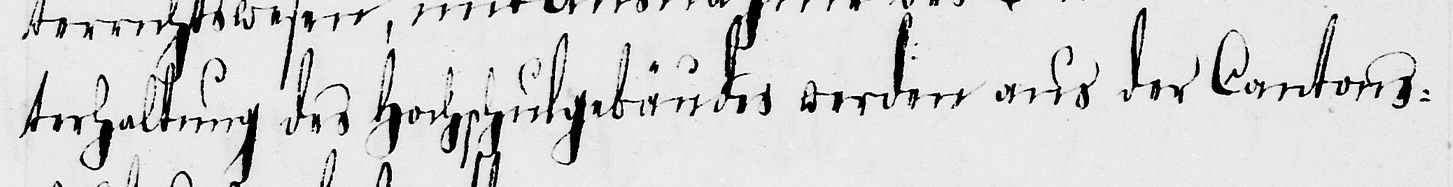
terhaltung des Hochschulgebäudes werden aus der Cantons¬
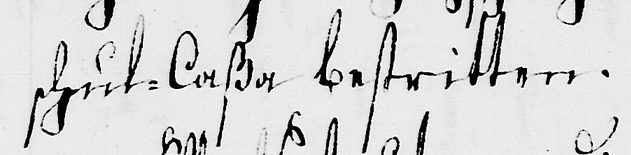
schul-Caßa bestritten.
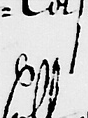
12.
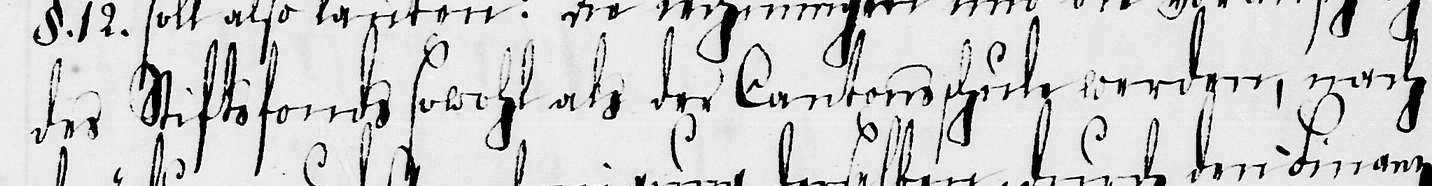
des Stiftsfonds sowohl als der Cantonsschule werden, nach
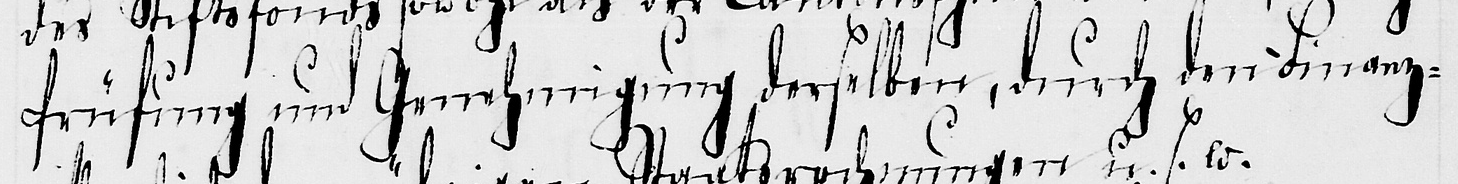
Prüfung und Genehmigung derselben, durch den Finanz¬
